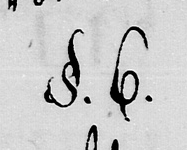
§. 6.
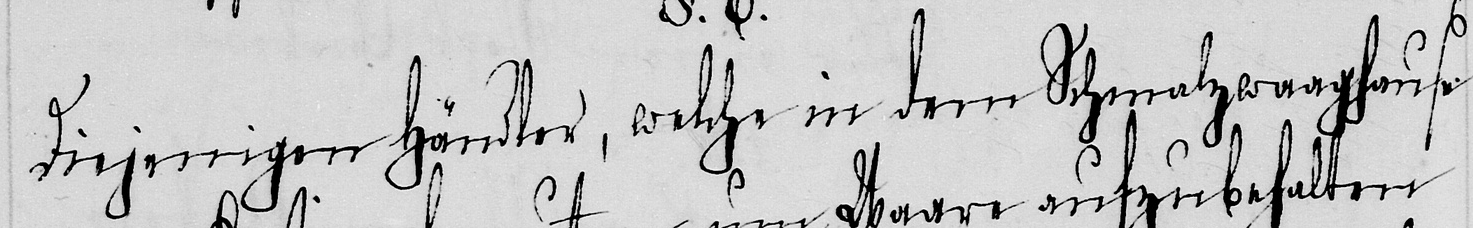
Diejenigen Händler, welche in dem Schmalzwaaghause
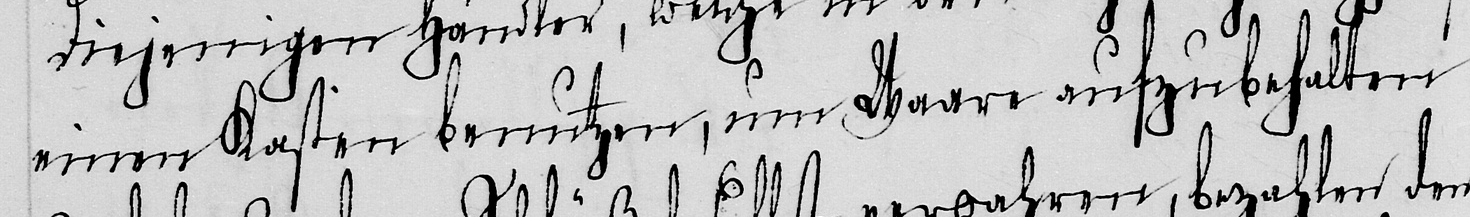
einen Kasten benutzen, um Waare aufzubehalten
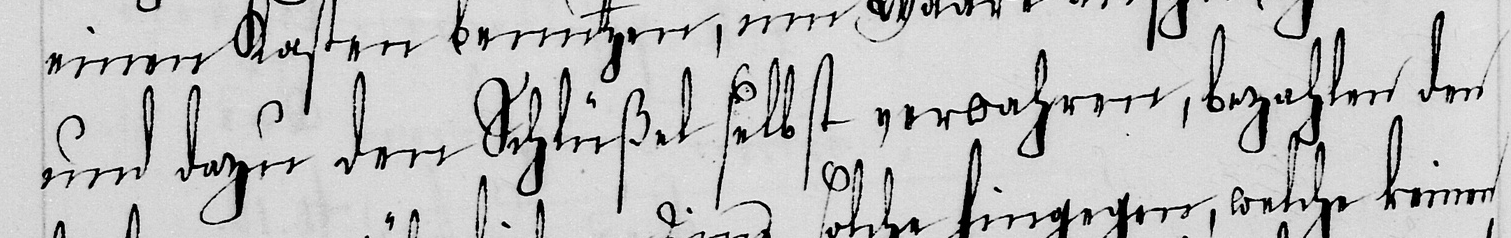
und dazu den Schlüßel selbst verwahren, bezahlen den
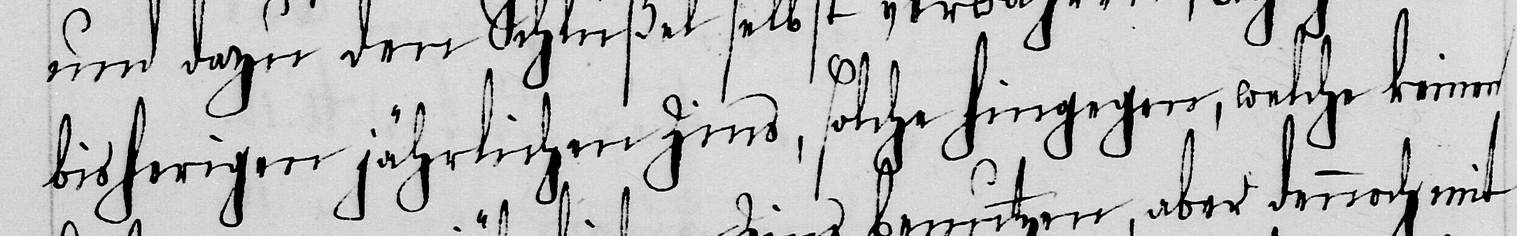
bisherigen jährlichen Zins, solche hingegen, welche keinen
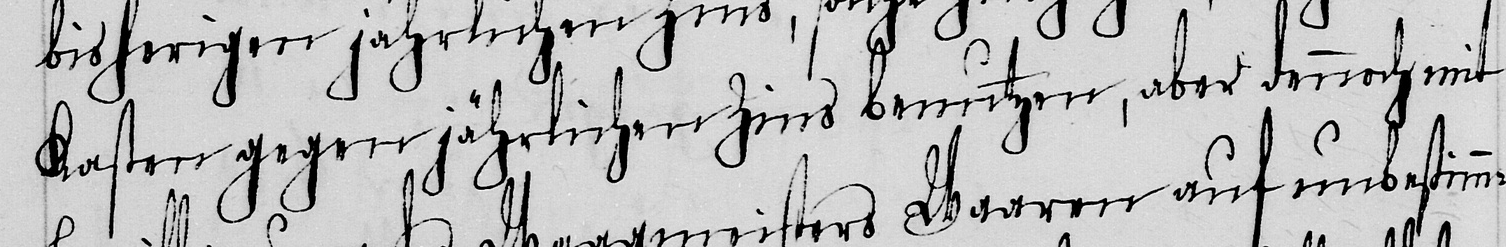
Kasten gegen jährlichen Zins benutzen, aber dennoch mit
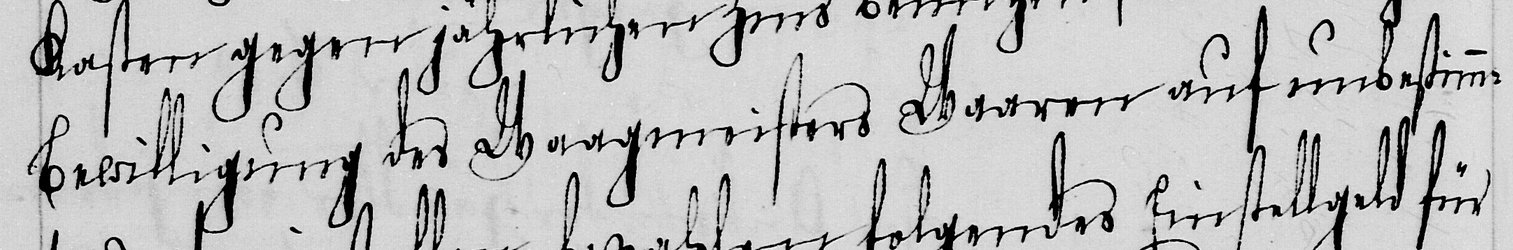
Bewilligung des Waagmeisters Waaren auf unbestim¬
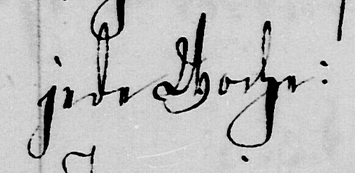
jede Woche:
